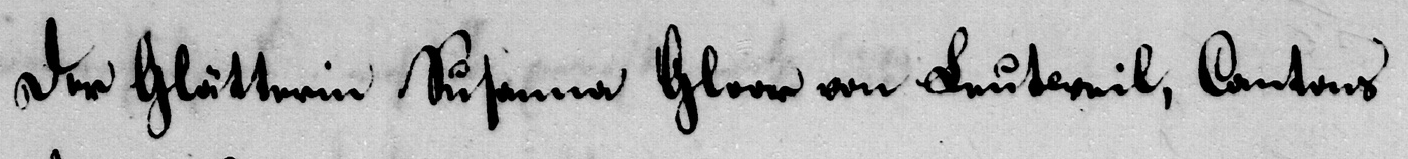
Der Glätterin Susanna Gloor von Leutweil, Cantons
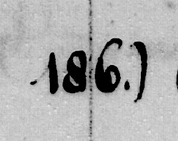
186.)
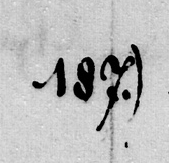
187.)
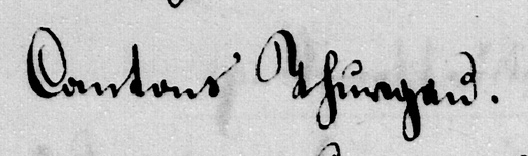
Cantons Thurgau.
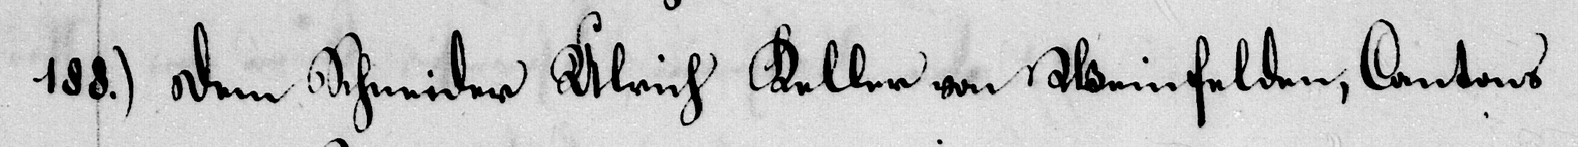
188.) Dem Schneider Ulrich Keller von Weinfelden, Cantons
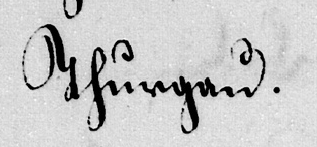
Thurgau.
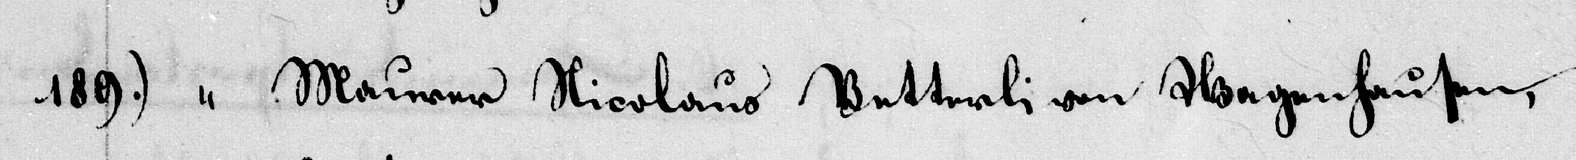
189.) “ Maurer Nicolaus Vetterli von Wagenhausen,
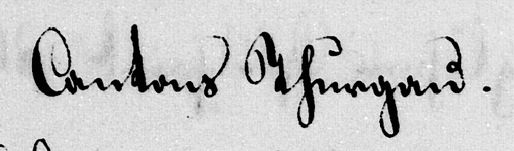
Cantons Thurgau.
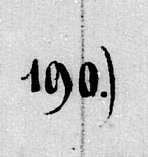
190.)
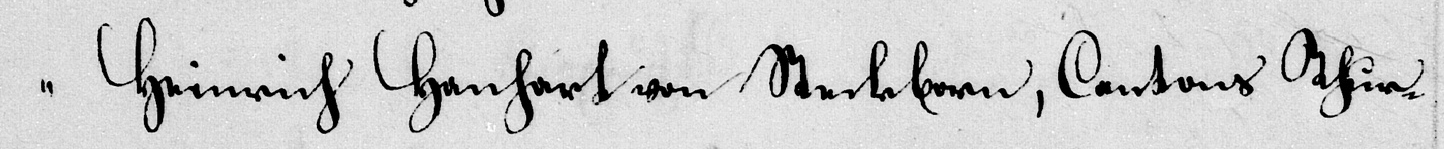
“ Heinrich Hanhard von Steckborn, Cantons Thur¬
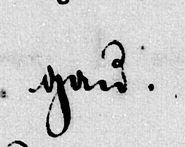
gau.
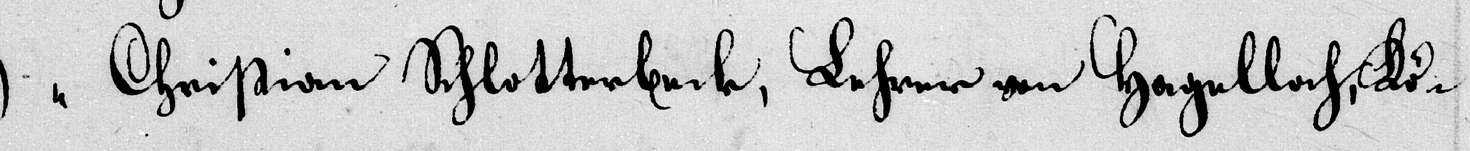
Christian Schlotterbeck, Lehrer von Hagelloch, Kö¬
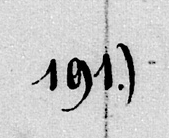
191.)
